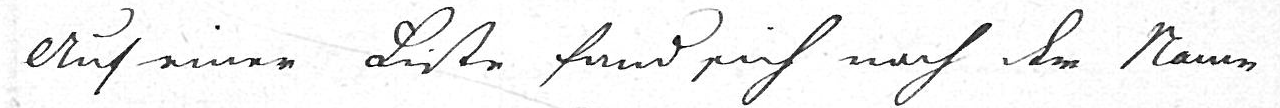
Auf einer Liste fand sich noch der Name
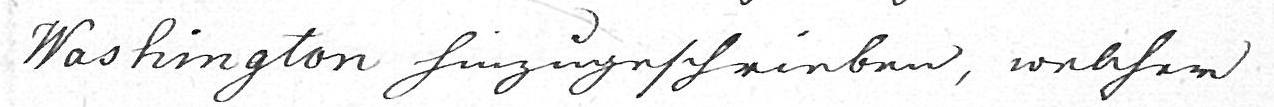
Washington hinzugeschrieben, welcher
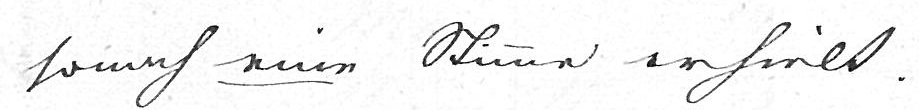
sonach eine Stimme erhielt.
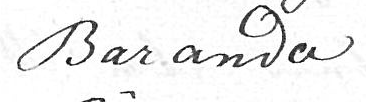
Baranda
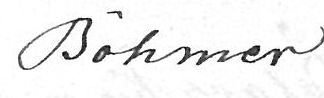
Böhmer
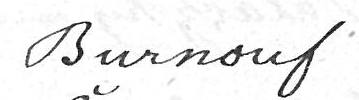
Bournouf
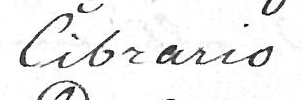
Cibrario
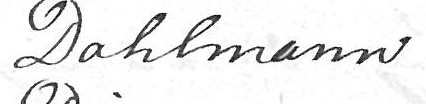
Dahlmann
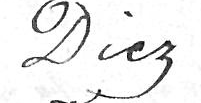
Diez
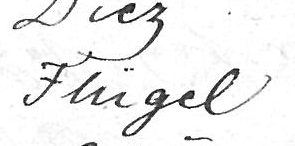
Flügel
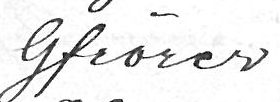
Gfrörer
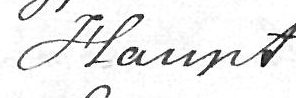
Haupt
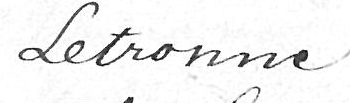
Letronne
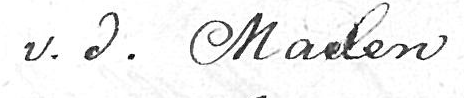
v. d. Maelen
